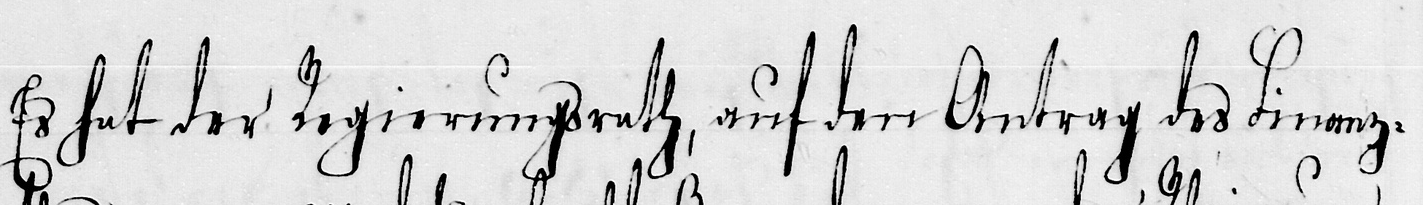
Es hat der Regierungsrath, auf den Antrag des Finanz¬
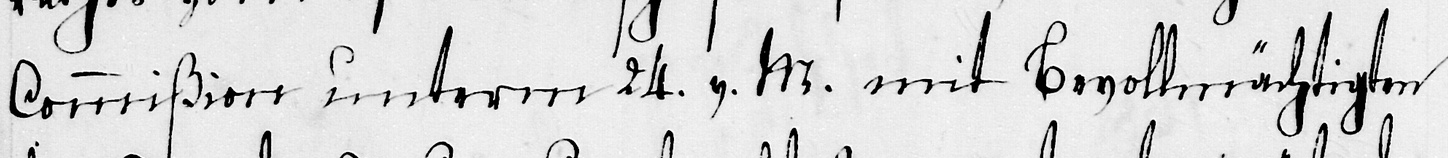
ommißion unterm 24. v. M. mit Bevollmächtigten
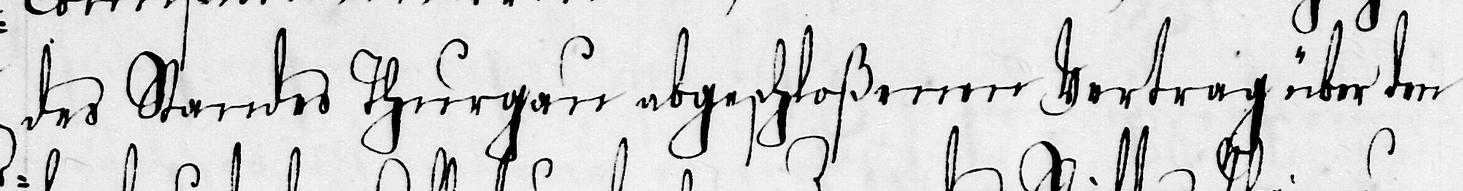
des Standes Thurgau abgeschloßenen Vertrag über den
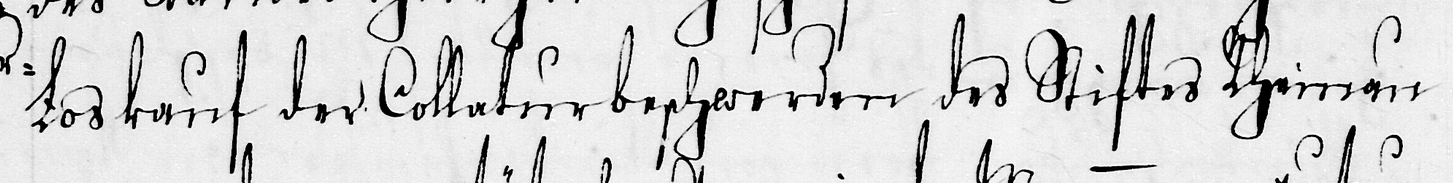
Loskauf der Collaturbeschwerden des Stiftes Rheinau
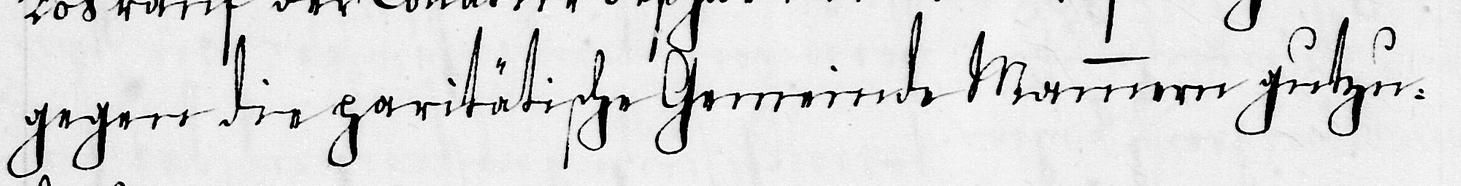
gegen die paritätische Gemeinde Mammern gutzu¬
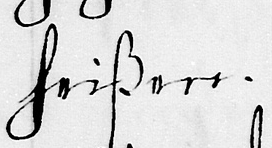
heißen.
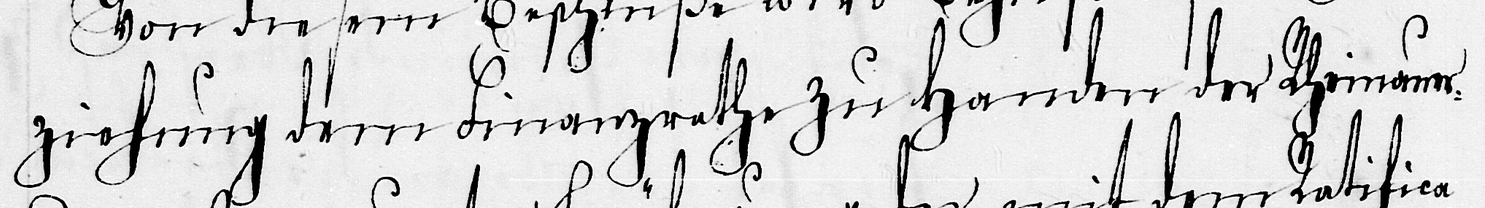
ziehung dem Finanzrathe zu Handen der Rheinaue¬
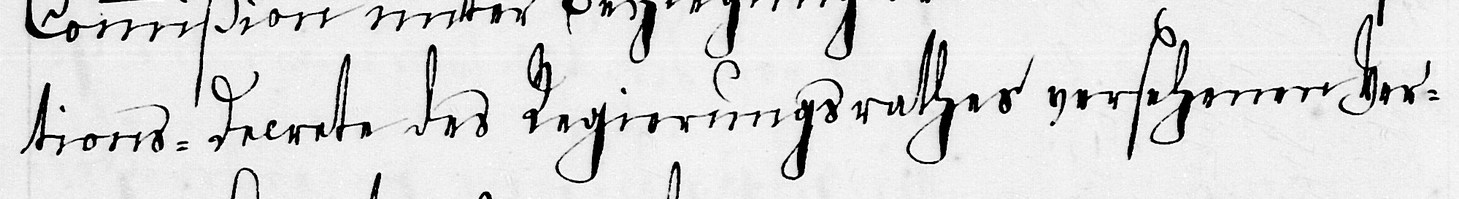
ations-Decrete des Regierungsrathes versehenen Ver¬
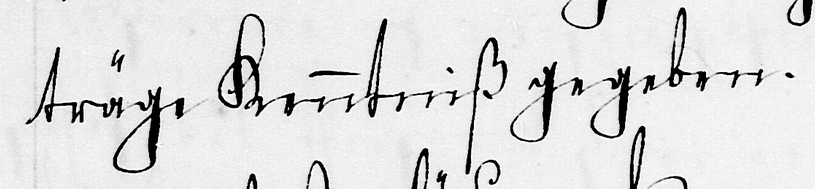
träge Kenntniß gegeben.
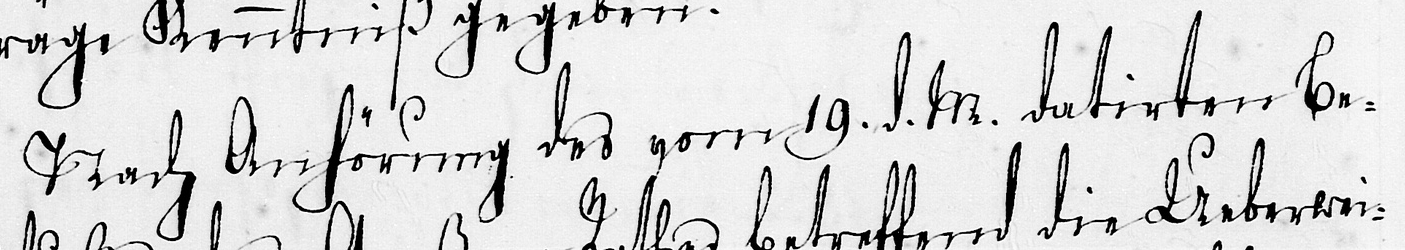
Nach Anhörung des vom 19. d. M. datirten Be¬
